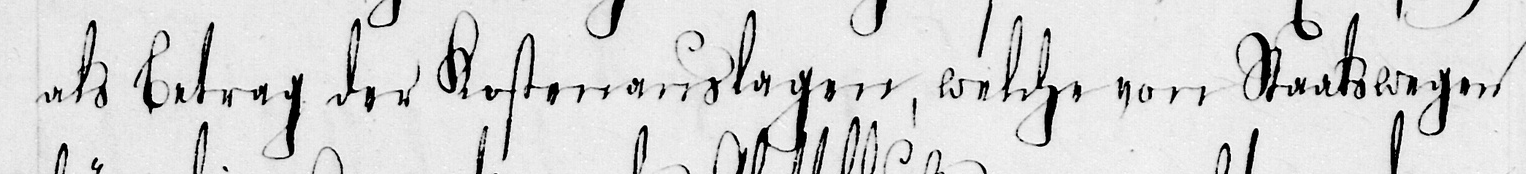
als Betrag der Kostenauslagen, welche von Staatswegen
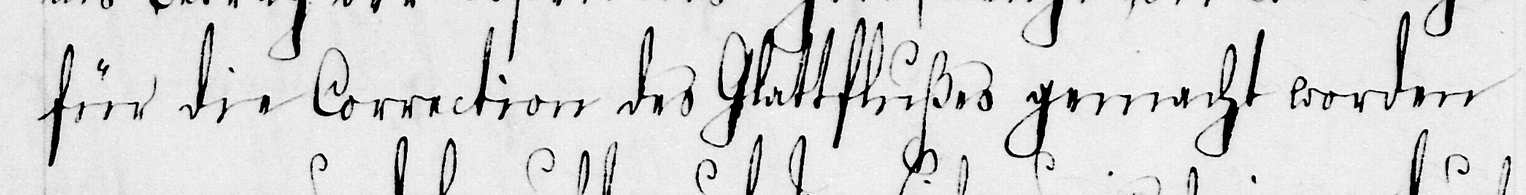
für die Correction des Glattflußes gemacht worden
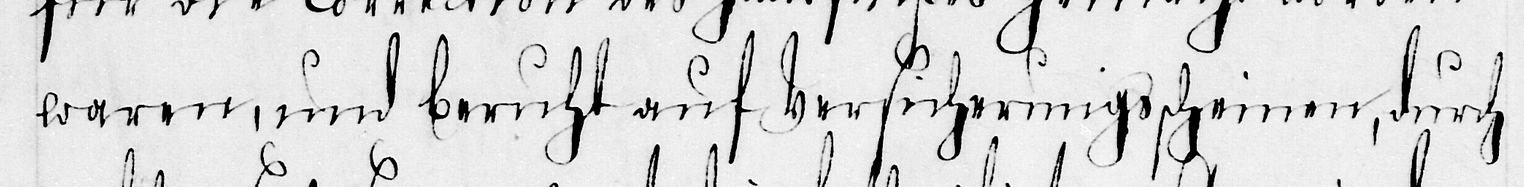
waren, und beruht auf Versicherungsscheinen, durch
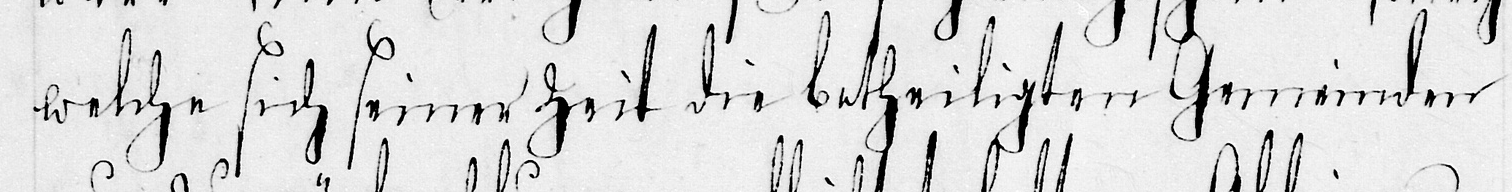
welche sich seiner Zeit die betheiligten Gemeinden
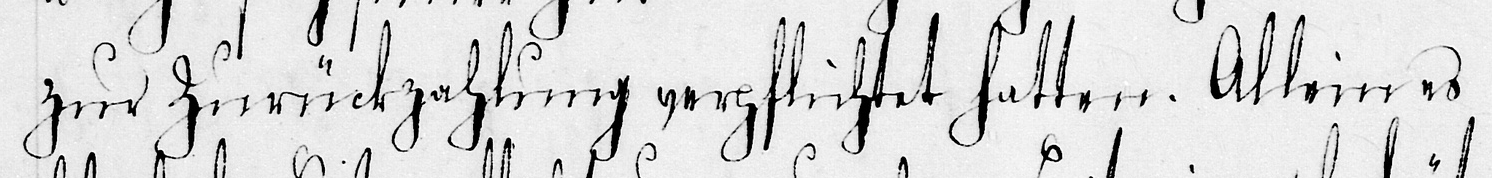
zur Zurückzahlung verpflichtet hatten. Allein es
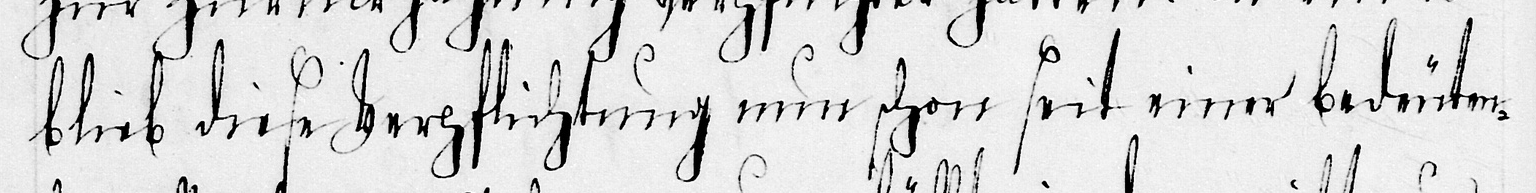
blieb diese Verpflichtung nun schon seit einer bedeuten¬
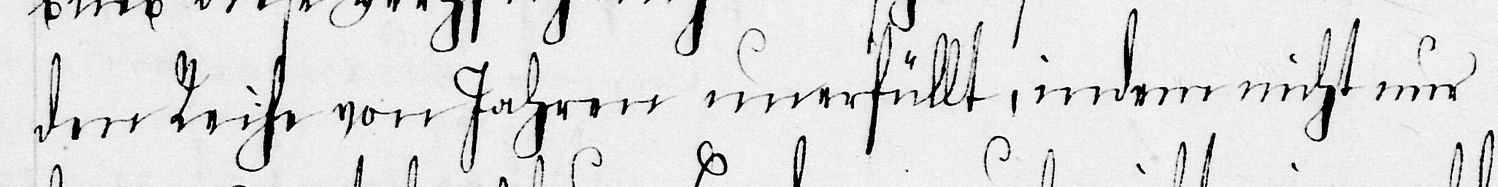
den Reihe von Jahren unerfüllt, indem nicht nur
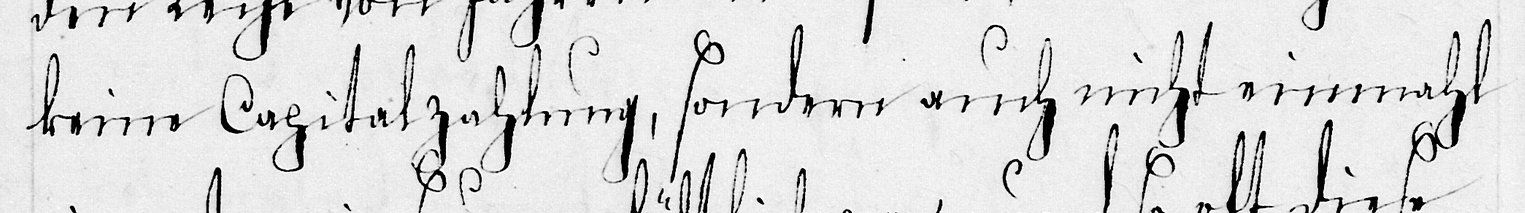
keine Capitalzahlung, sondern auch nicht einmahl
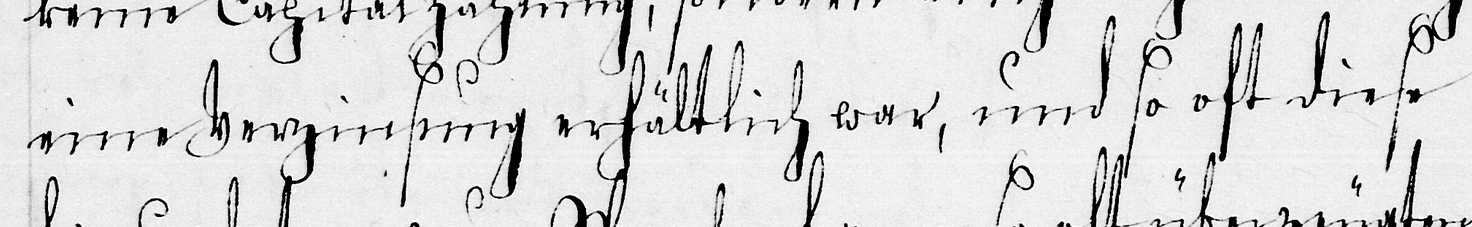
eine Verzinsung erhältlich war, und so oft diese
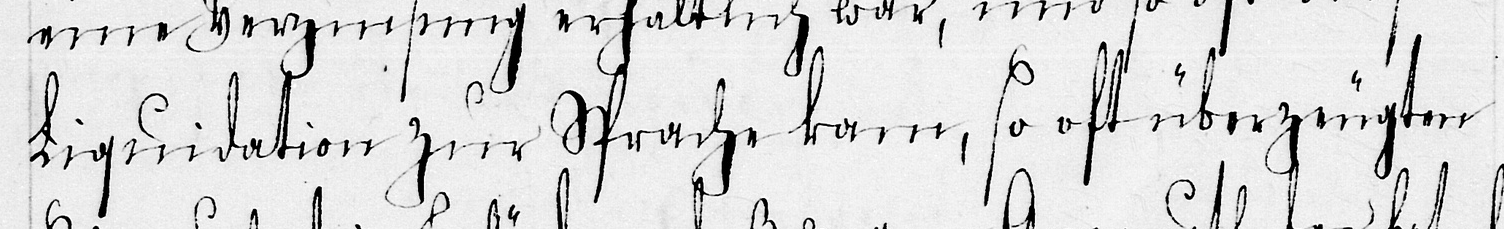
Liquidation zur Sprache kam, so oft überzeugten
